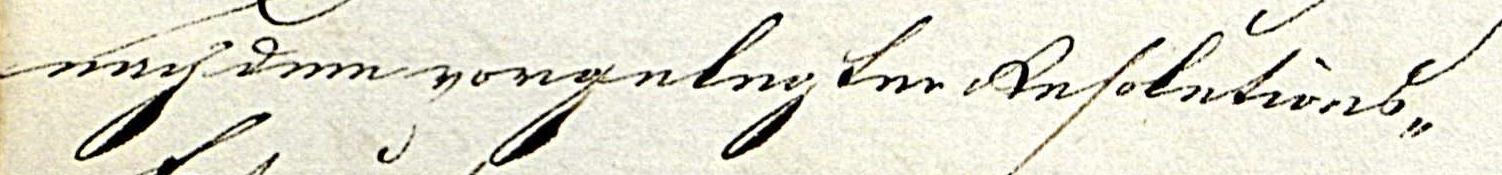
nach dem vorgelegter Ansolutives¬
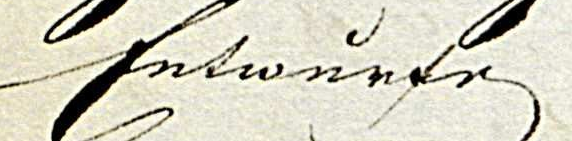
Entwurfe
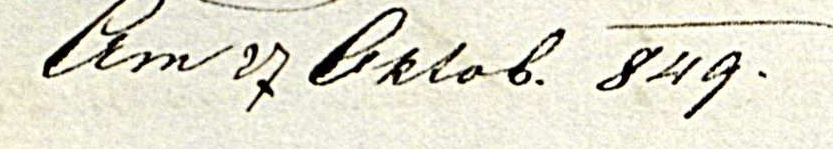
Am 27 Oktob. 849.
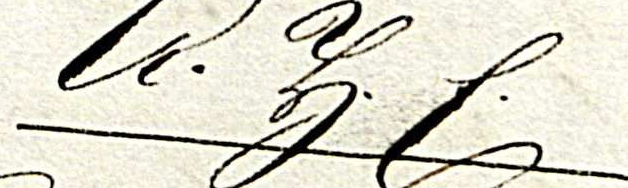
A. H. E.
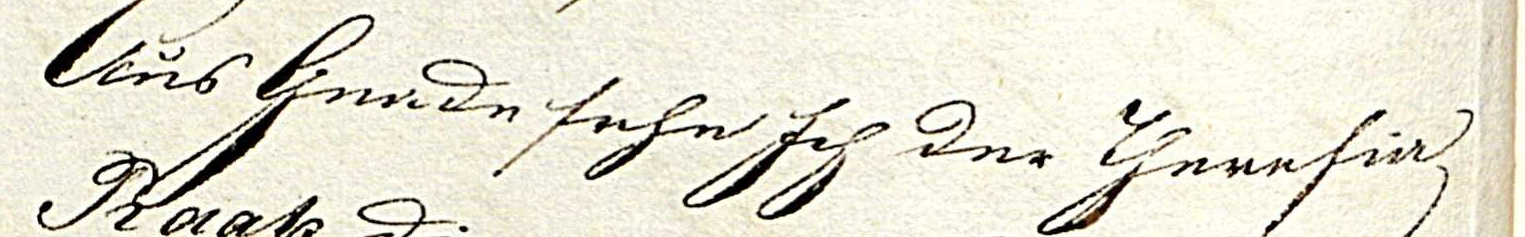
Aus Gnade sehe Jch der Theresia
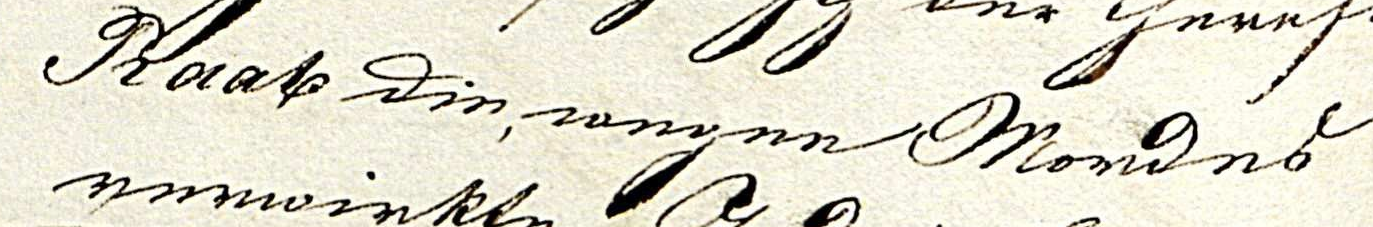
Raab die, wegen Mordes
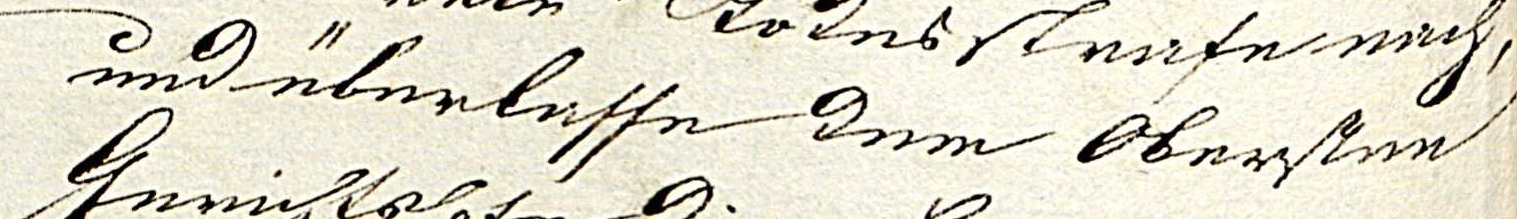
und überlasse dem Obersten
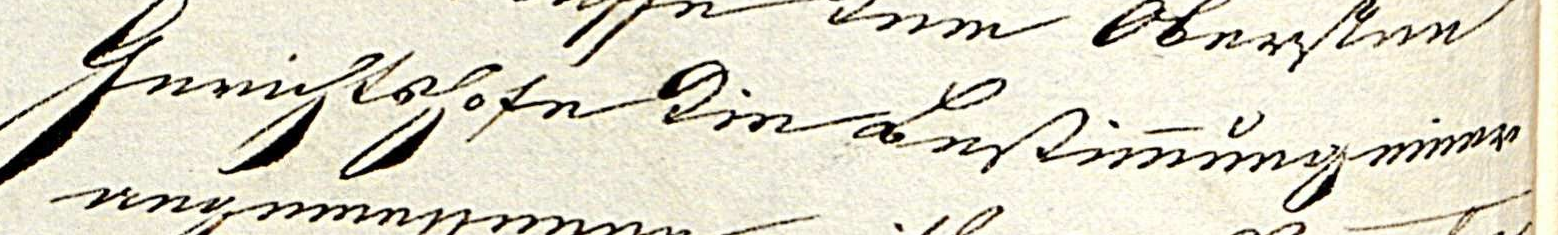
Gerichtshofe die Bestimung einer
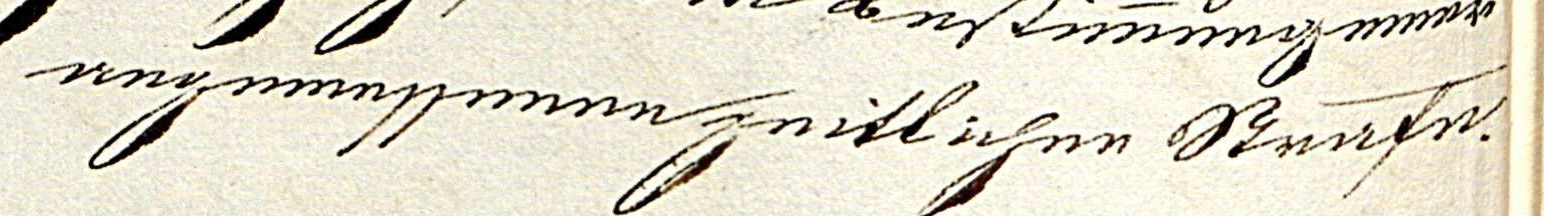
angemessenen zeitlichen Strafe.
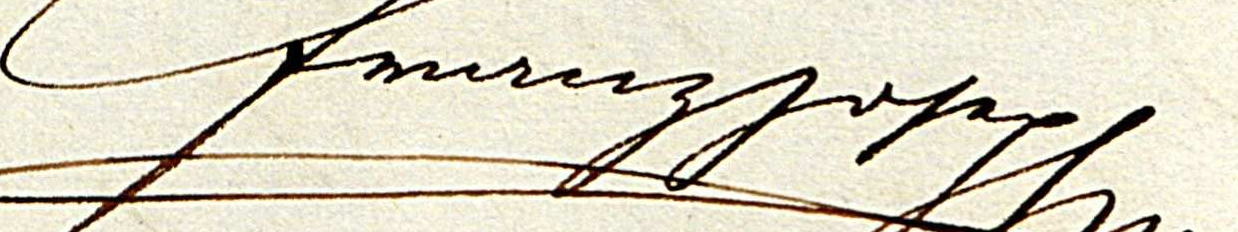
Franz Joseph
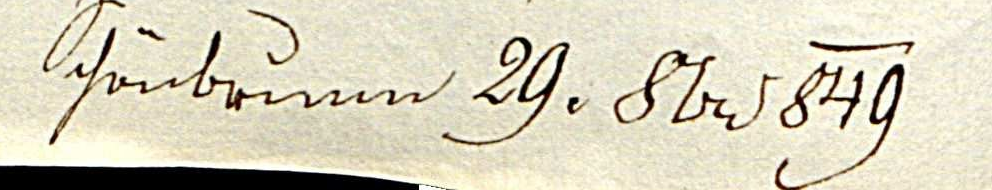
Schönbrunn 29. 8br. 849
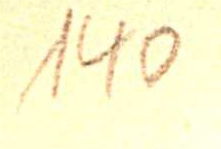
140
